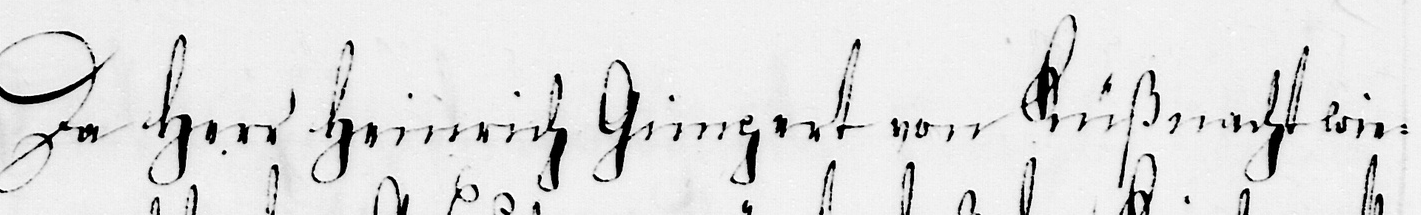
Da Herr Heinrich Gimpert von Küßnacht wie¬
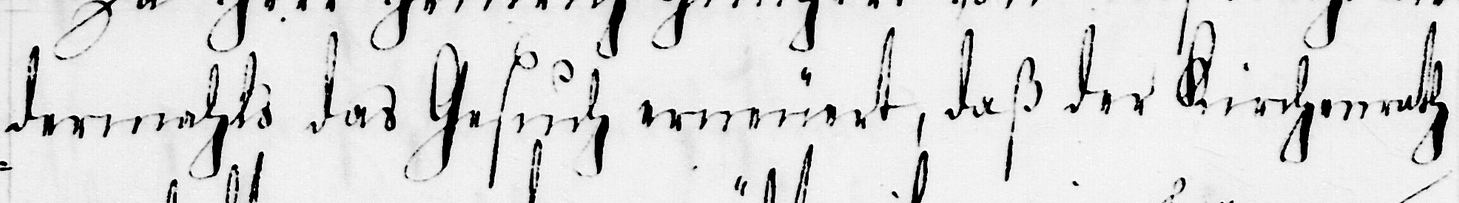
dermahls das Gesuch erneuert, daß der Kirchenrath
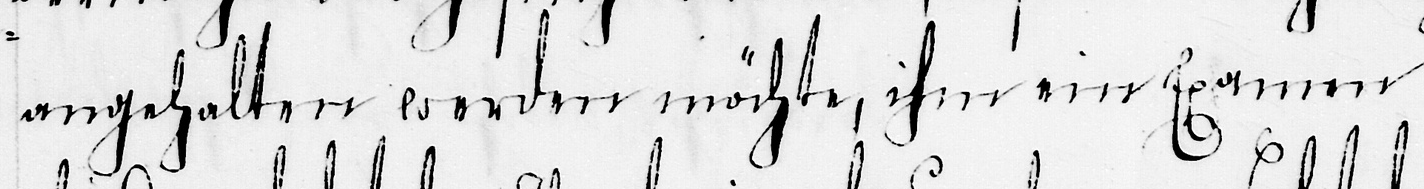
angehalten werden möchte, ihm ein Examen
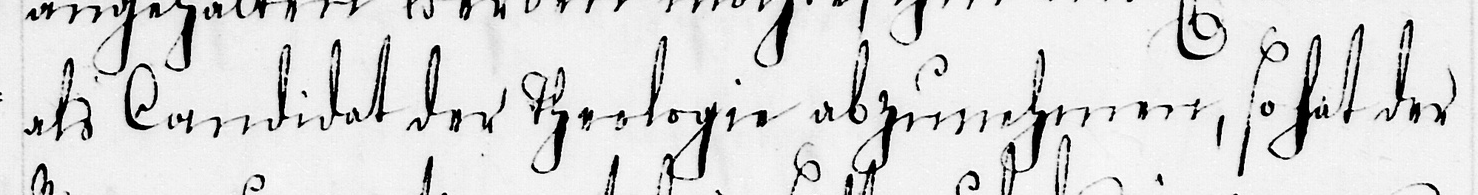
als Candidat der Theologie abzunehmen, so hat der
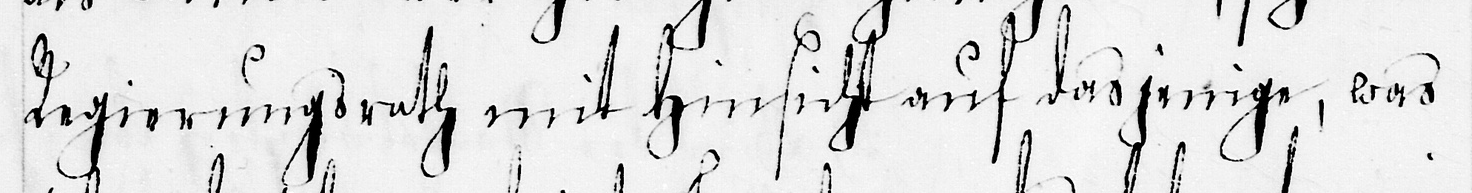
Regierungsrath mit Hinsicht auf dasjenige, was
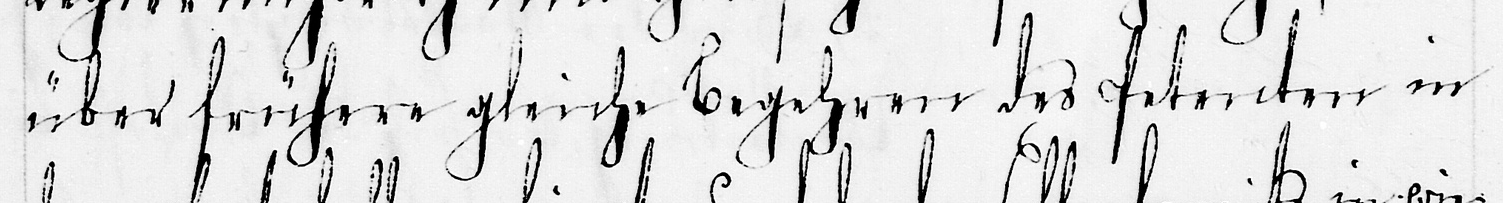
über frühere gleiche Begehren des Petenten in
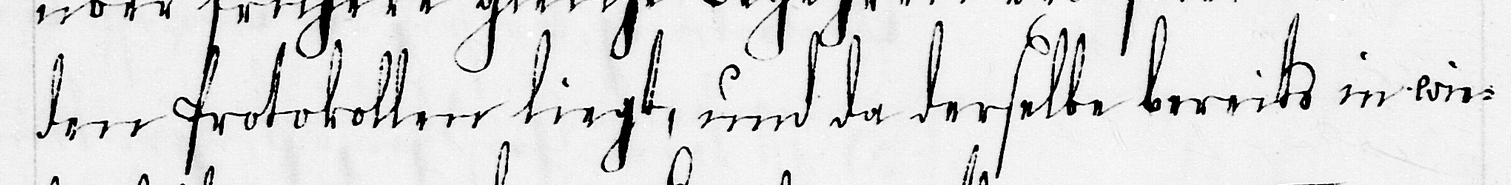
den Protokollen liegt, und da derselbe bereits in wie¬
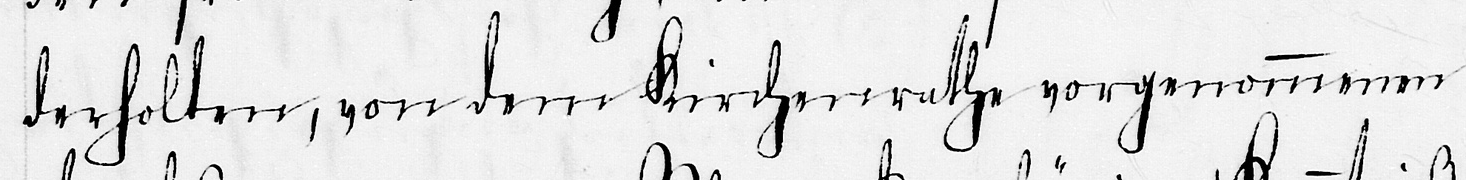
derholten, von dem Kirchenrathe vorgenommenen
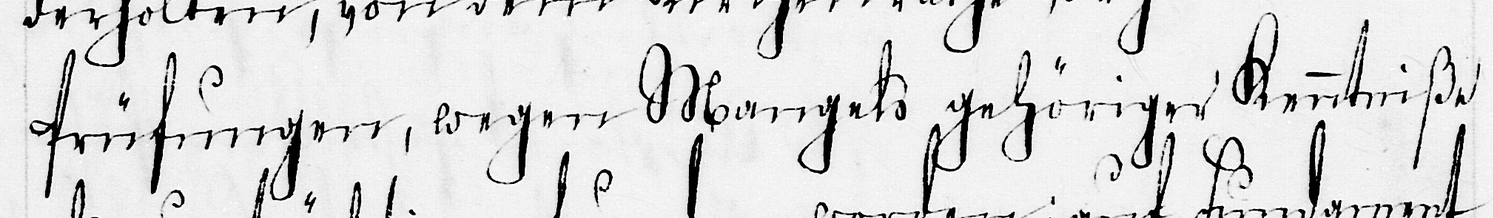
Prüfungen, wegen Mangels gehöriger Kenntniße
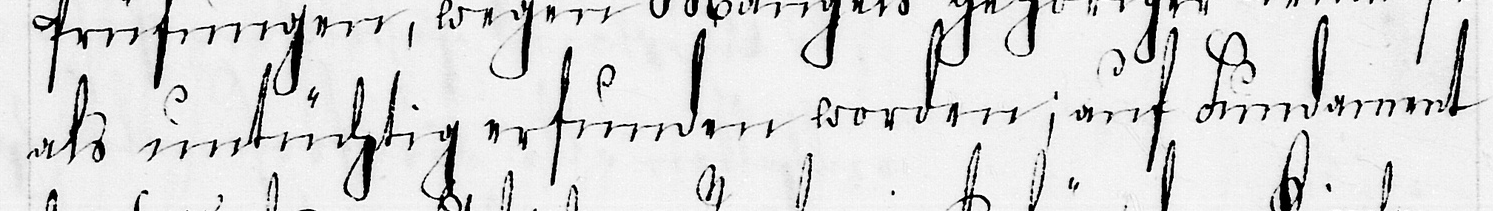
als untüchtig erfunden worden; auf Fundament
